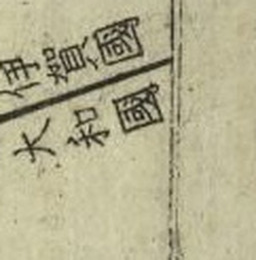大和國
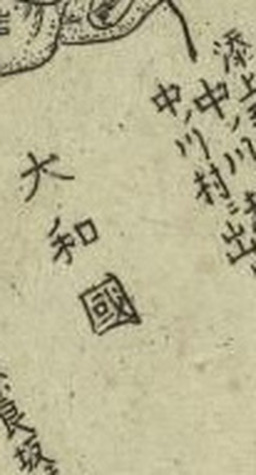大和國
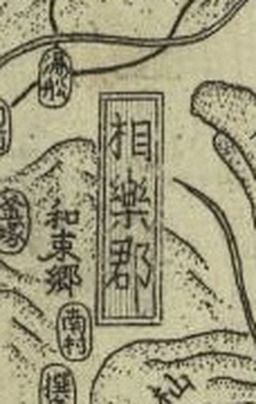相樂郡
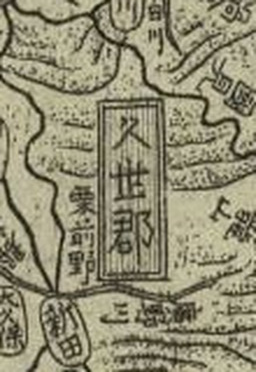久世郡
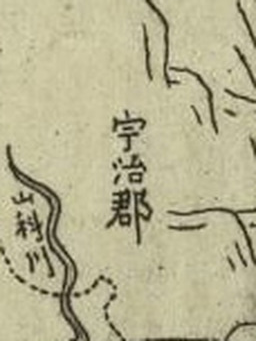宇治郡
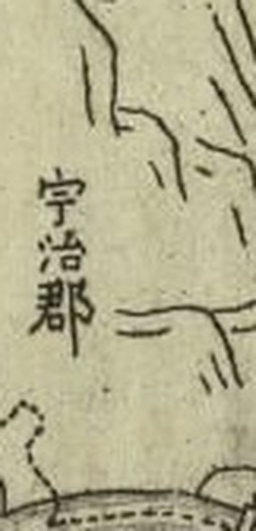宇治郡
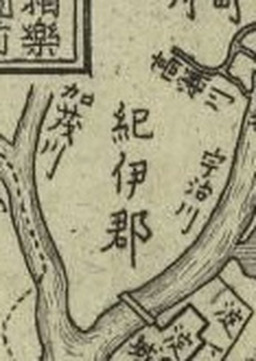紀伊郡
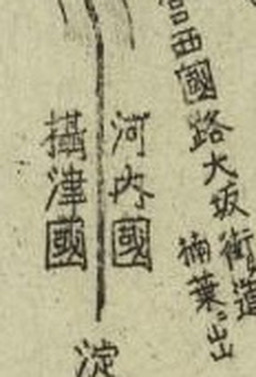河内國
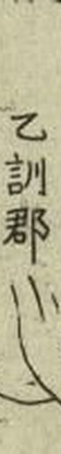乙訓郡
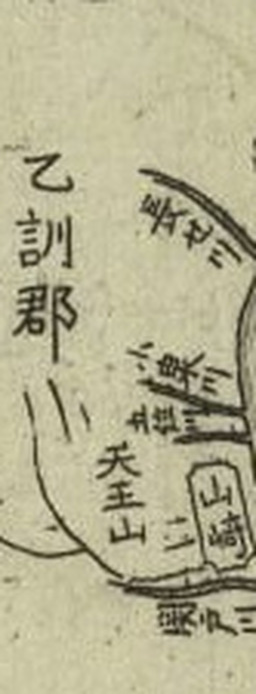乙訓郡

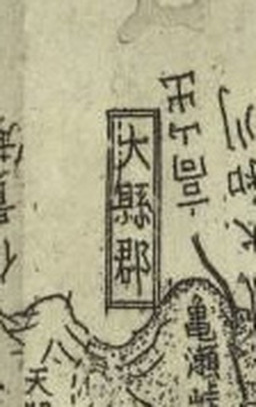大懸郡
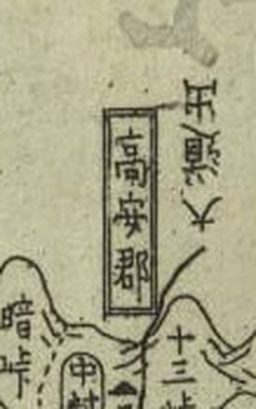高安郡
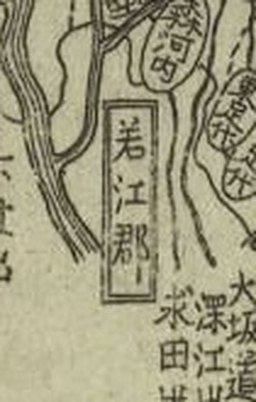若江郡
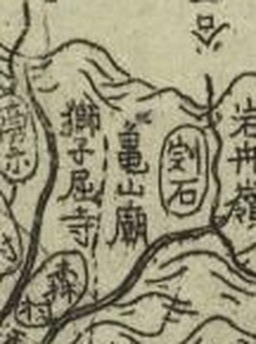亀山廟
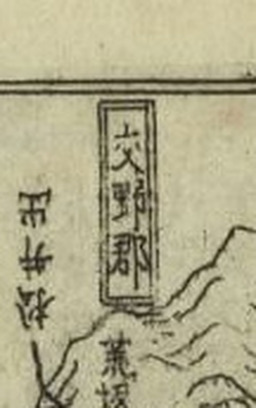交野郡

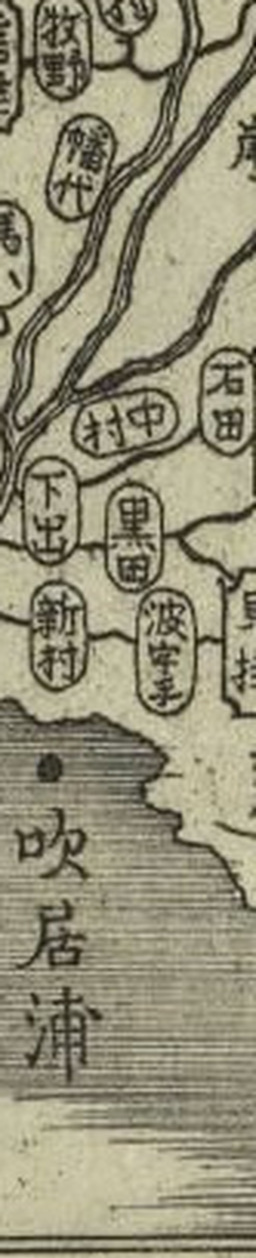●吹居浦
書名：大日本国細図 東国之部 上
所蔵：University of the Ryukyus Library
